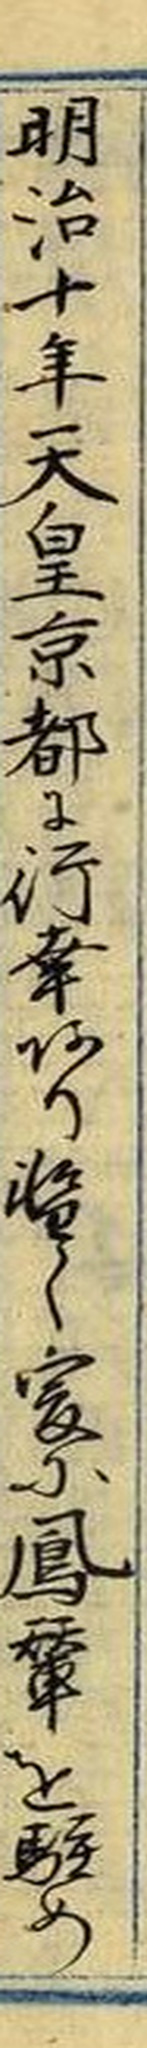明治十年天皇京都に行幸あり暫く爰に鳳輦を駐め
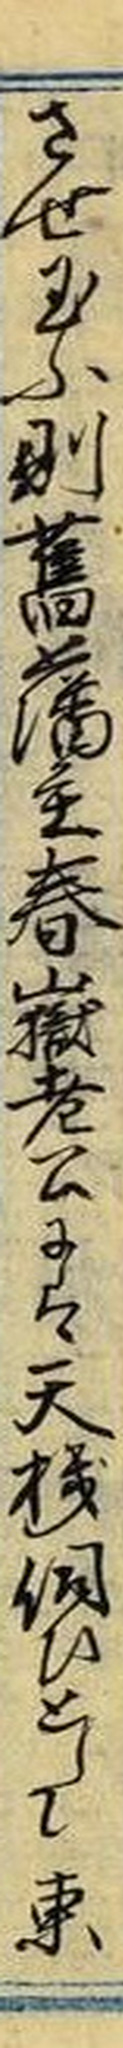させ玉ふ則旧藩主春嶽老公には天機伺ひとして東
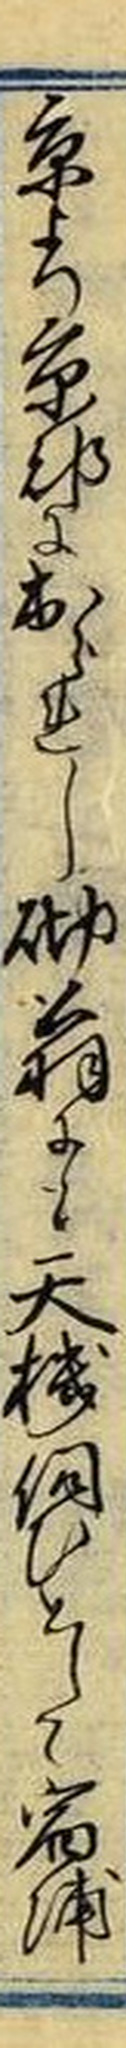京より京都に出られし砌翁にも天機伺ひとして宿浦
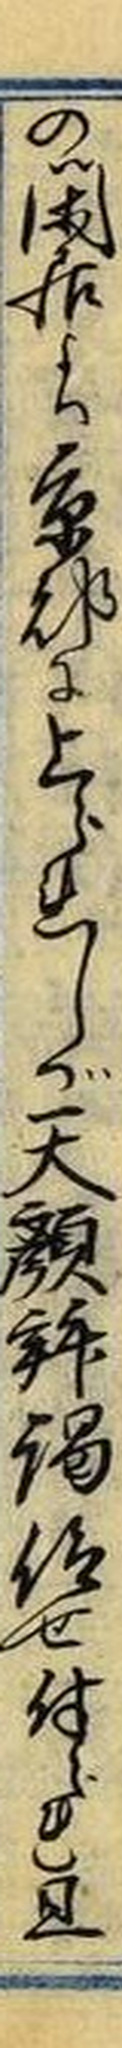の閑居より京都に上られしが天顔拝謁仰せ付られ且
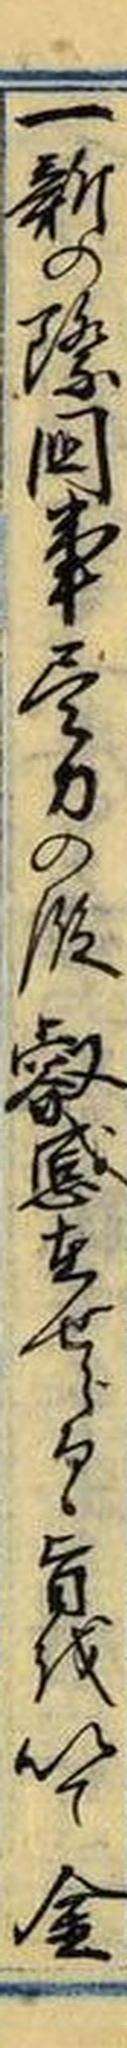一新の際国事尽力の段叡感在せらるゝ旨を以て金

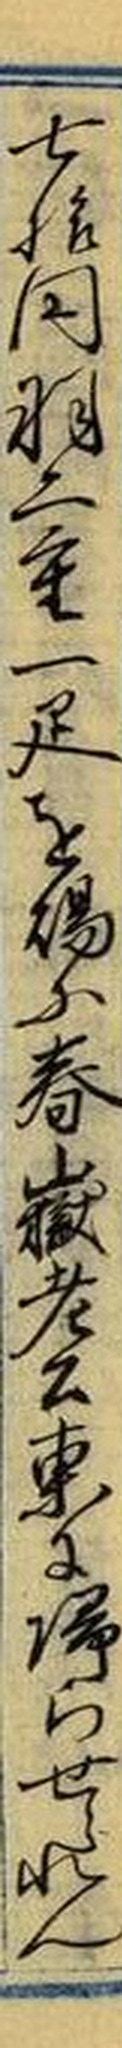七拾円羽二重一疋を賜ふ春嶽老公東に帰らせられん
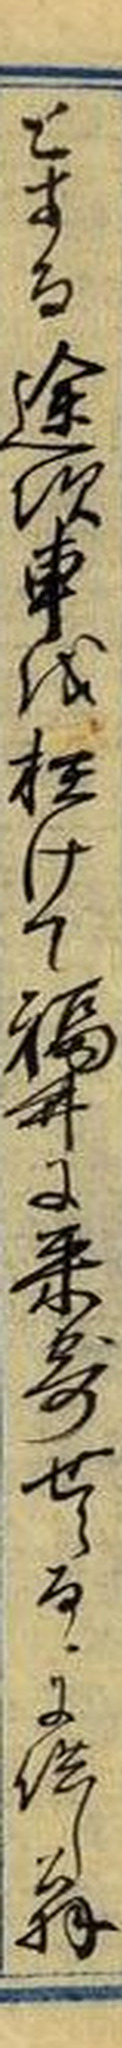とする途次車を枉けて福井に来寄せらるゝに供し翁
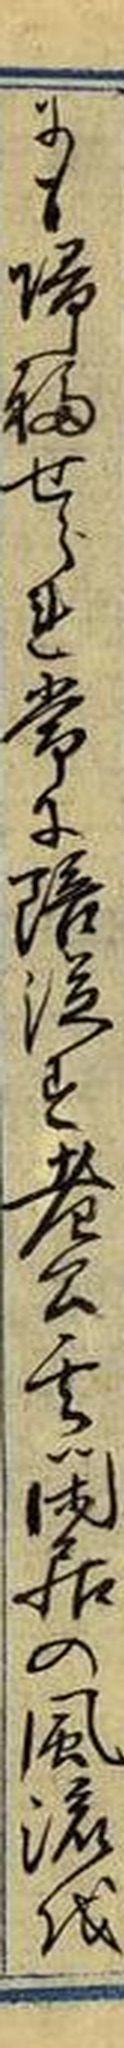にも帰福せられ常に陪従す老公其閑居の風流を
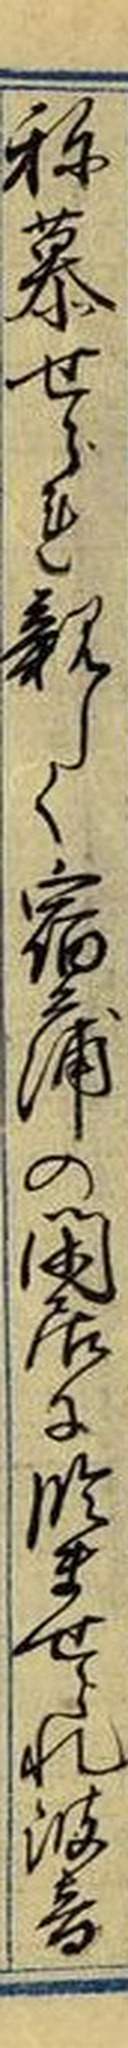称慕せられ親しく宿浦の閑居に臨ませられ波音
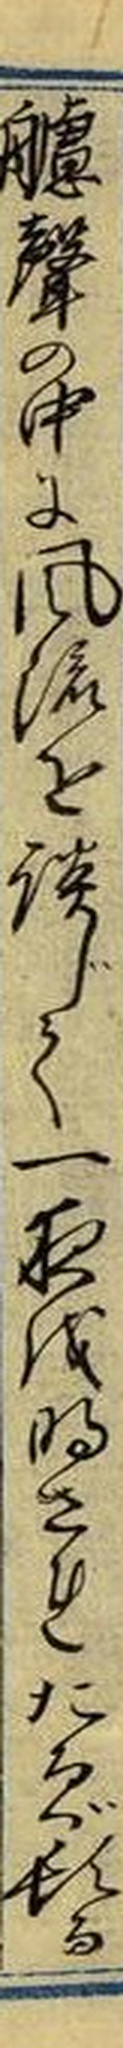艪声の中に風流を談じて一夜を明されたるが頓而
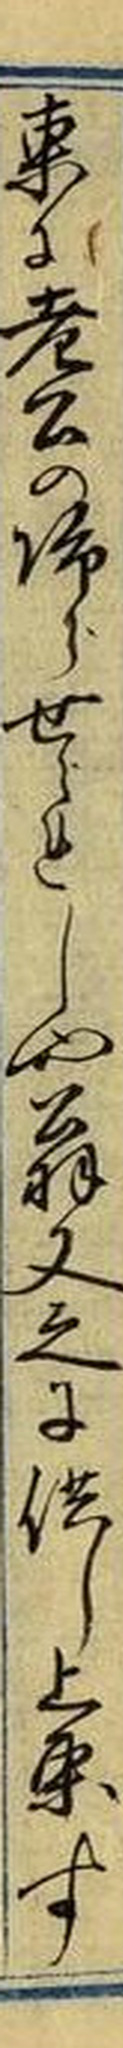東に老公の帰らせられしや翁又之に供し上京す
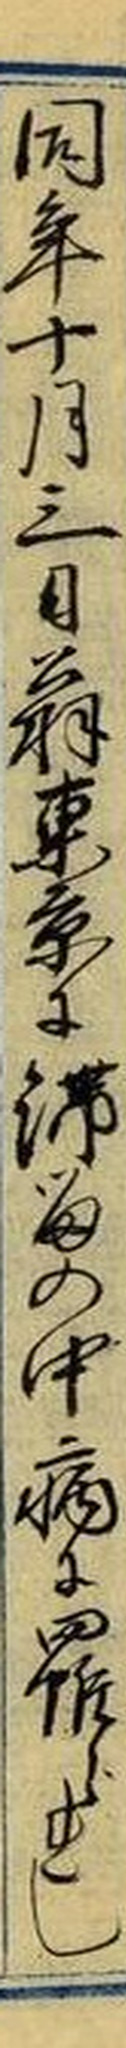同年十月三日翁当東京に滞留の中病に罹られし
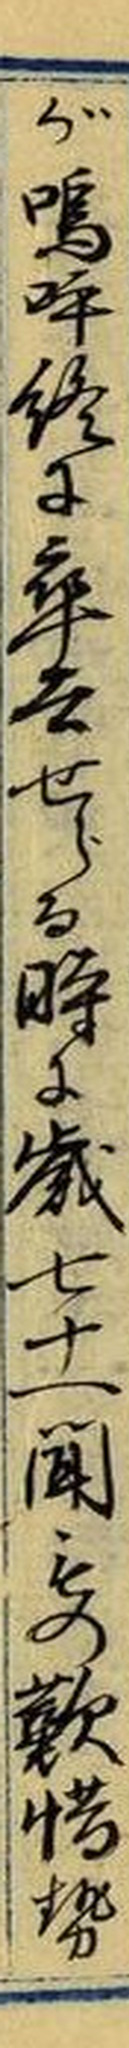が嗚呼終に卒去せらる時に歳七十一聞もの歎惜せ
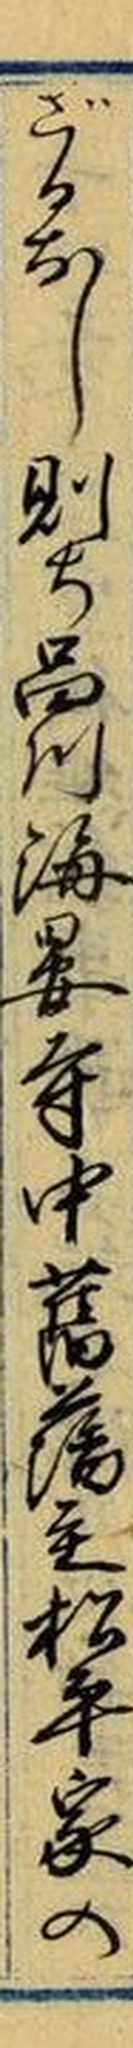ざるなし則ち品川海晏寺中旧藩主松平家の
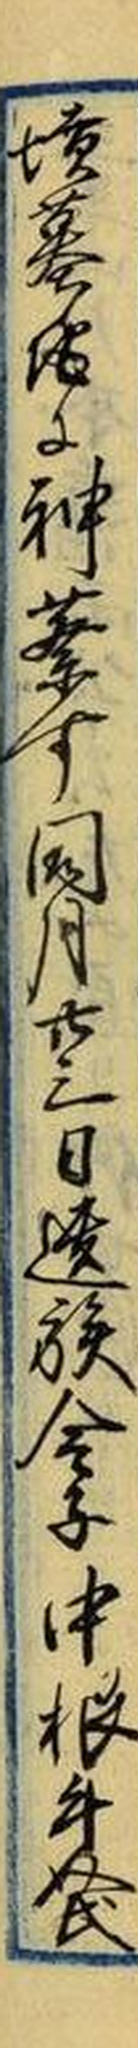墳墓地に神蔡す同月廿三日遺族令子中根牛介氏
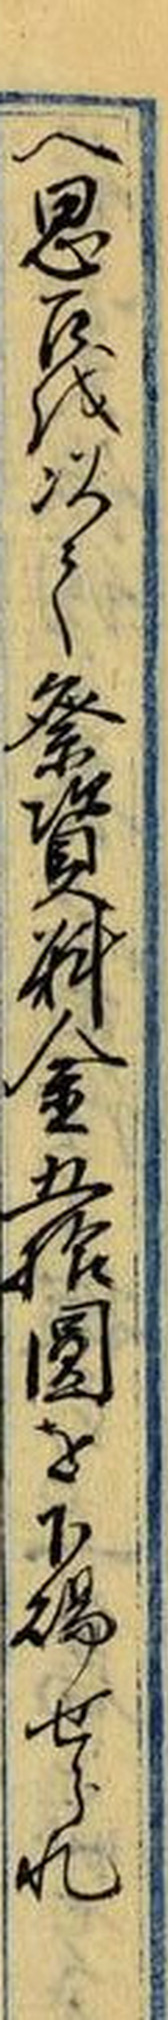へ思召を以て祭資料金五拾円を下賜せられ
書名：温古集 三巻
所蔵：福井県文書館 Fukui Prefectural Archives
